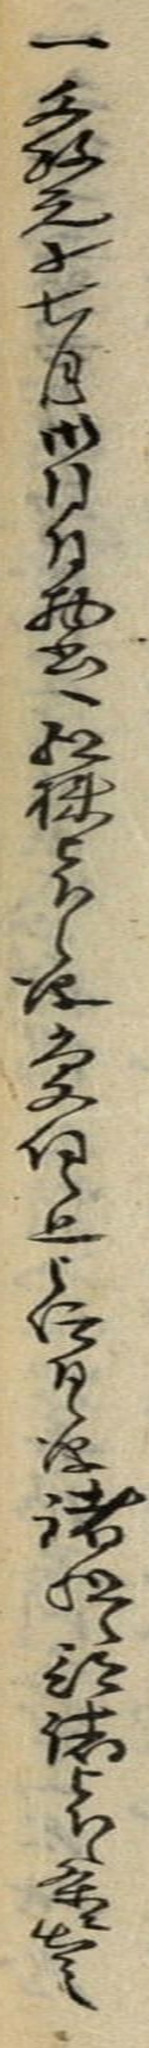一文政元寅七月御目付物書へ組株被下候儀尚又伺之上被仰付候儀諸組之部請被下候条に出之
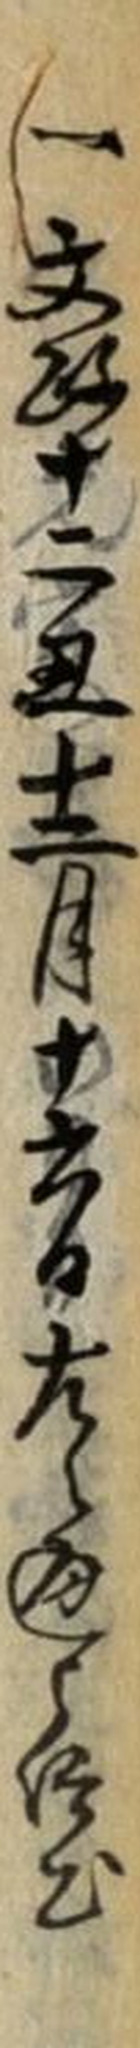一文政十二丑十二月十六日左之通被仰出
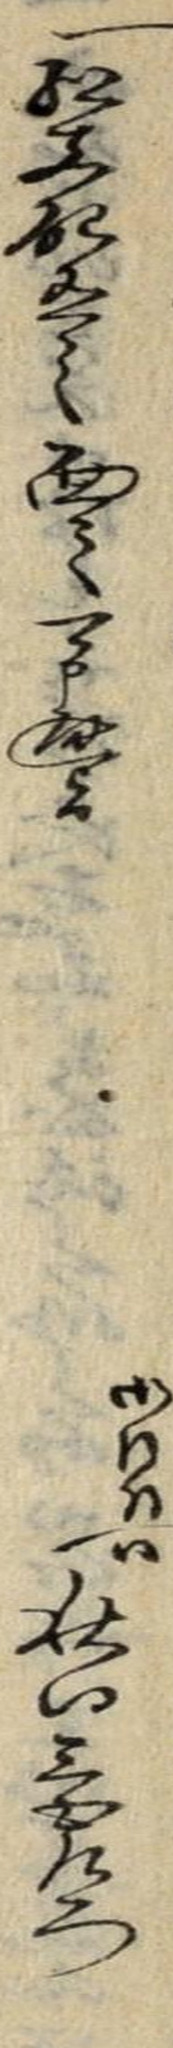組支配有之面々可申通旨御目付同秋田三五左衛門
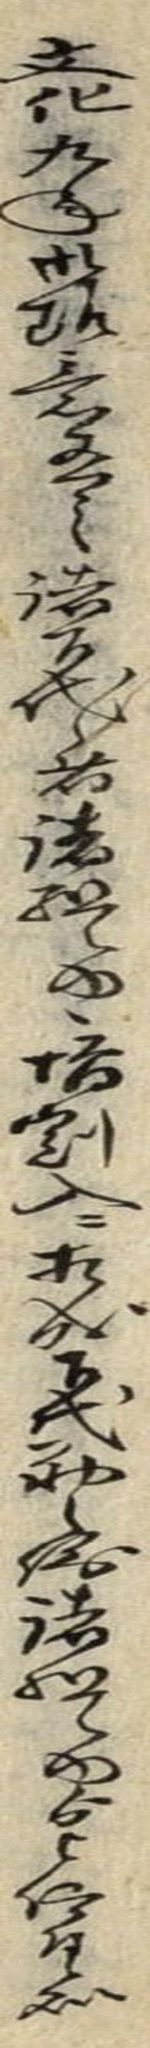文化九年御趣意有之諸下代之者諸組之内へ増割入に相成下代勤之儀諸組之内ゟ被仰付候処
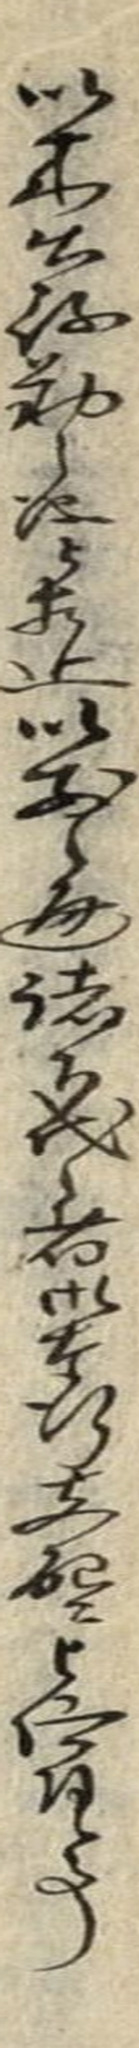以来出役勤之儀被相止以前之通諸下代之者御奉行支配に被仰候事
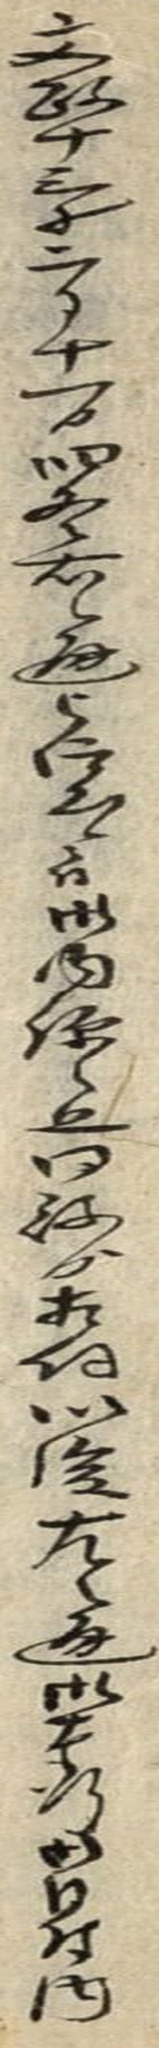一文政十三寅二月十一日旧冬右之通被仰出候に付御内評候上同役ゟ相伺以後左之通御奉行御目付内
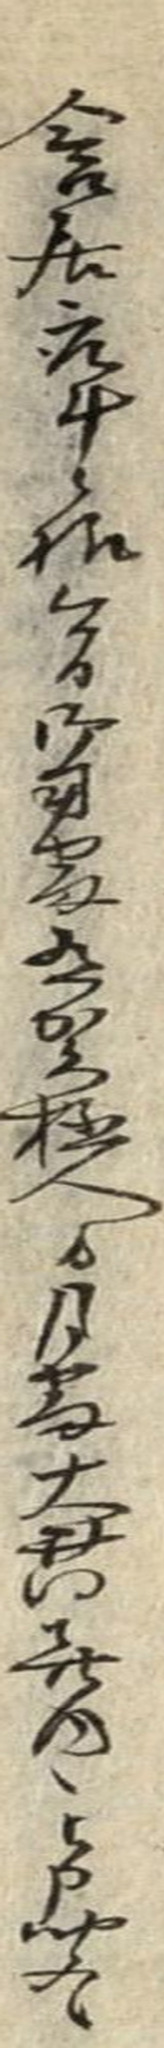含居取斗候様今日御用番有賀極人方月番大井田喜内へ被申聞候
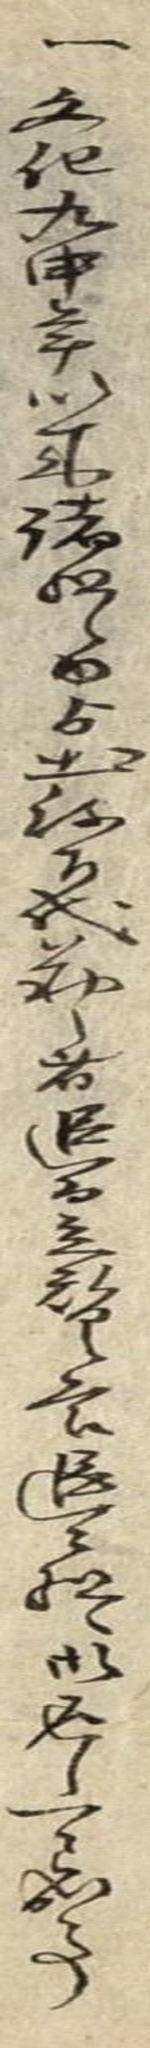一文化九申年以来諸組之内ゟ出役下代勤之者追而主替之節追々組へ御返し可被成候事
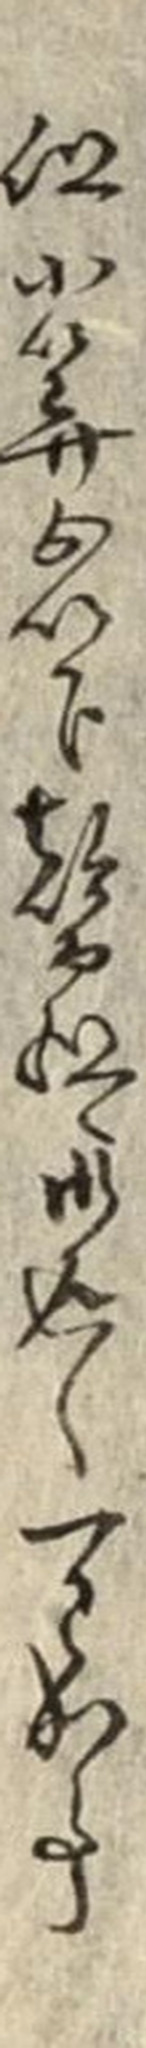但小算ゟ以下暫組へ御返し可被成候事
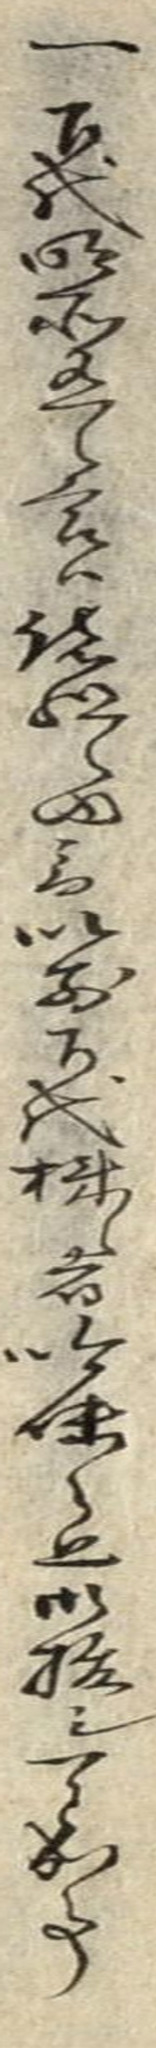一下代明所有之候節は諸組之内に而以前下代株之者吟味之上御放し可被成候事
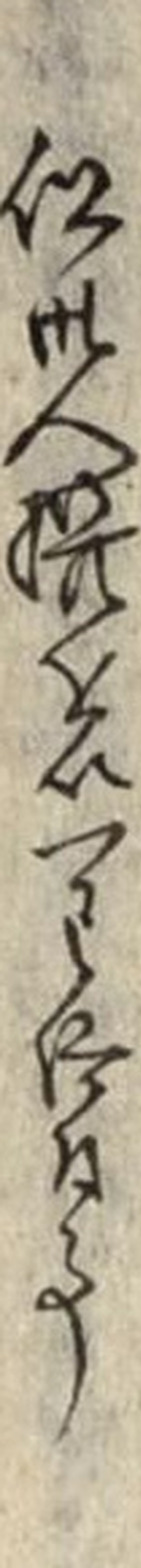但御人撰を以可被仰付候事
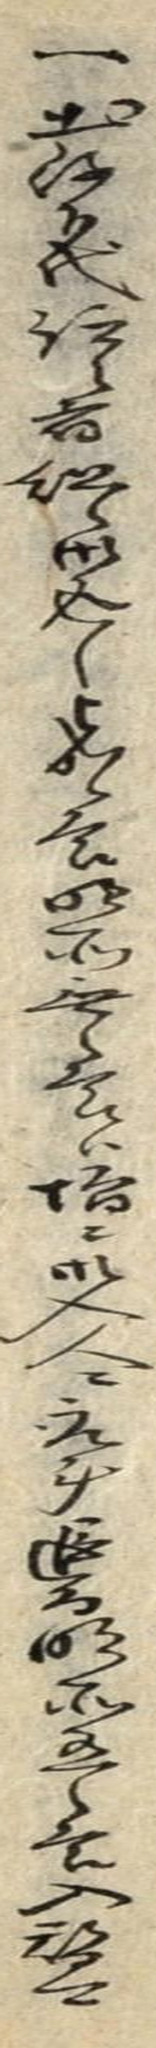一出役下代跡之者組へ御返し被成候節明所無之節は増に御入人に取斗追而明所有之節入替可
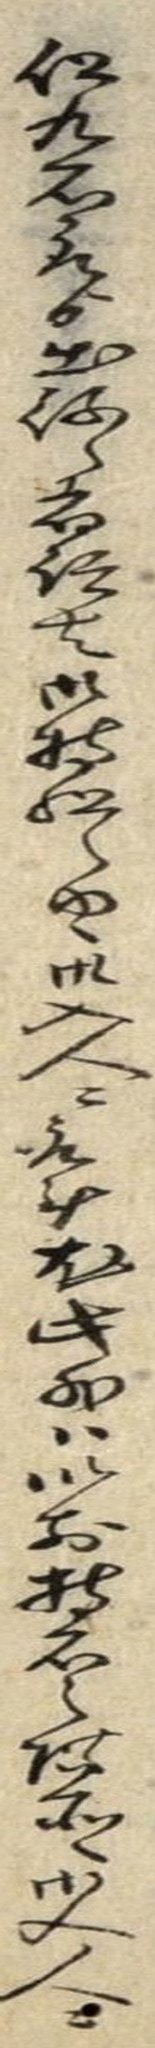但九石取ゟ出役候者跡は御持組之内へ御入人に取斗尤此外は以前持石之場所へ御入人に

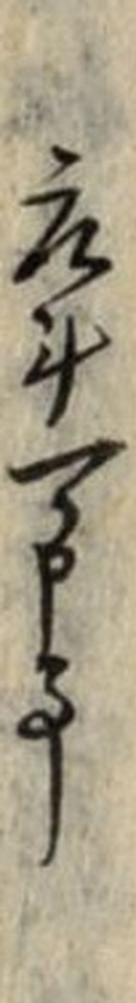取斗可申事
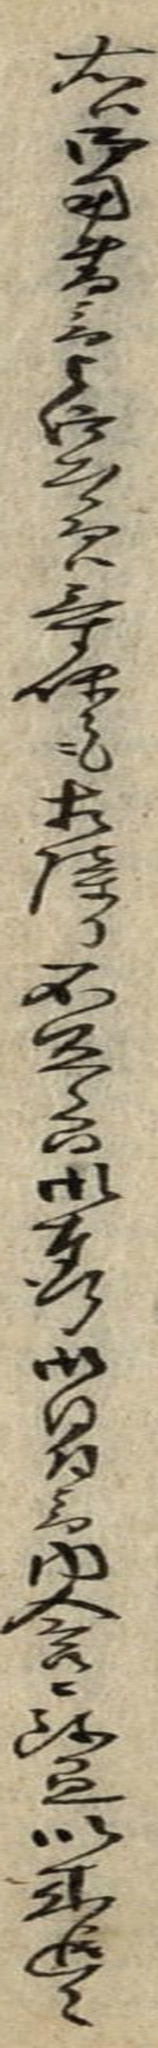右は御用番に而被仰出候而は気味にも相障り不宜候間御奉行御目付に而内含に致置以来追々
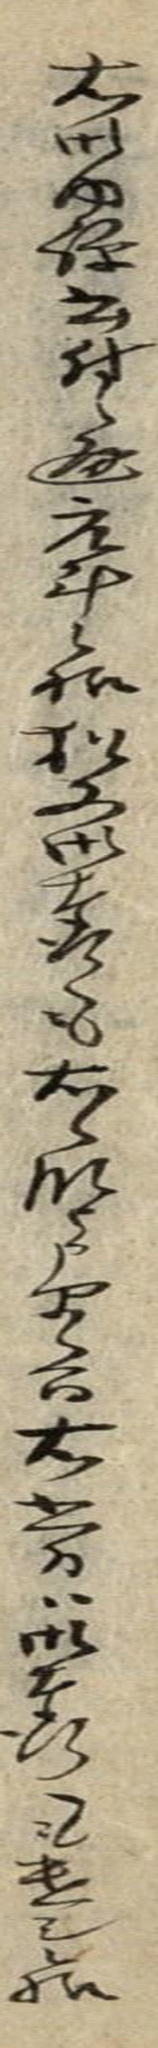右御内評書付之通取斗候様猶又御奉行へも右之段被申聞候間右書付は御奉行へも遣し候様
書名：御用并被仰出之部
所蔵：福井県文書館 Fukui Prefectural Archives
